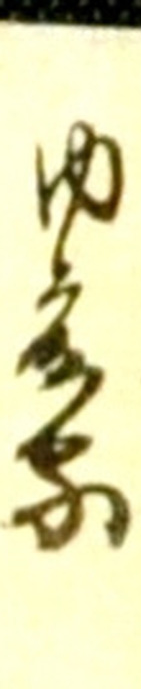内藤家

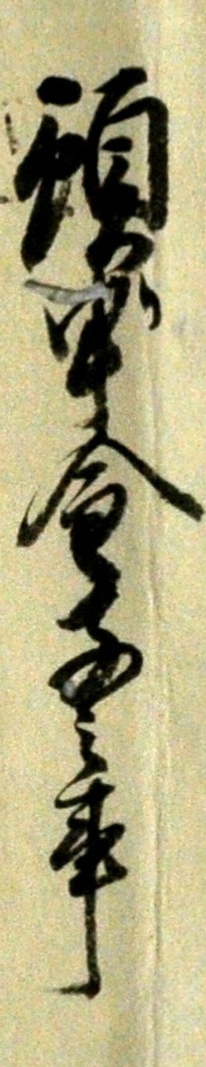預り申金子之事
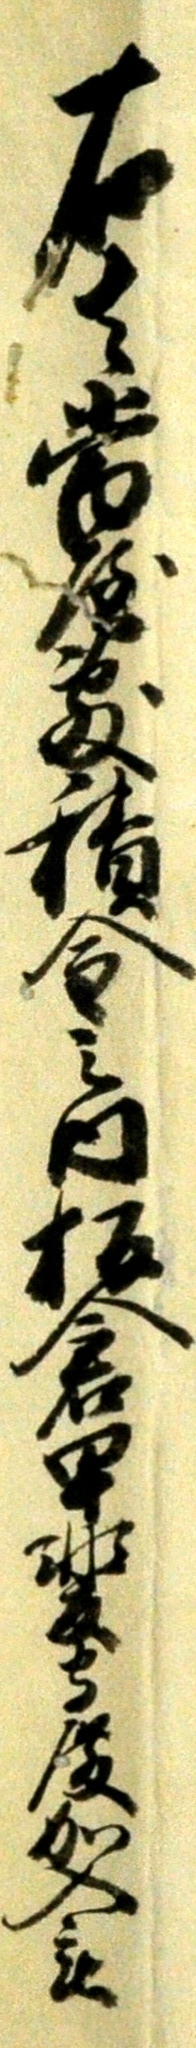右者当屋敷積金之内板倉甲斐守殿加入被
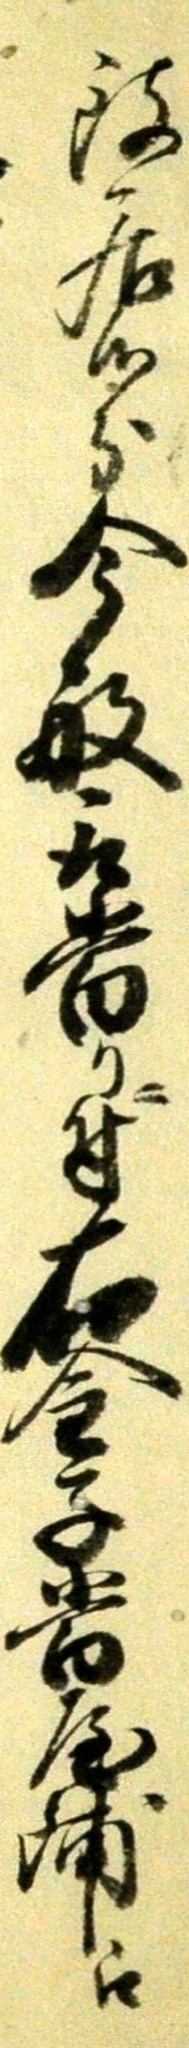致居候分今般取当りニ付右金子当屋敷江
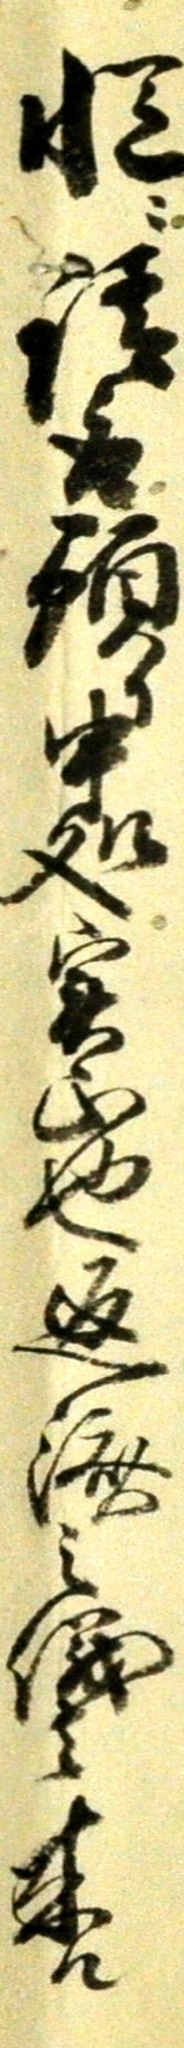慥ニ請取預り申処実正也返済之儀者来ル
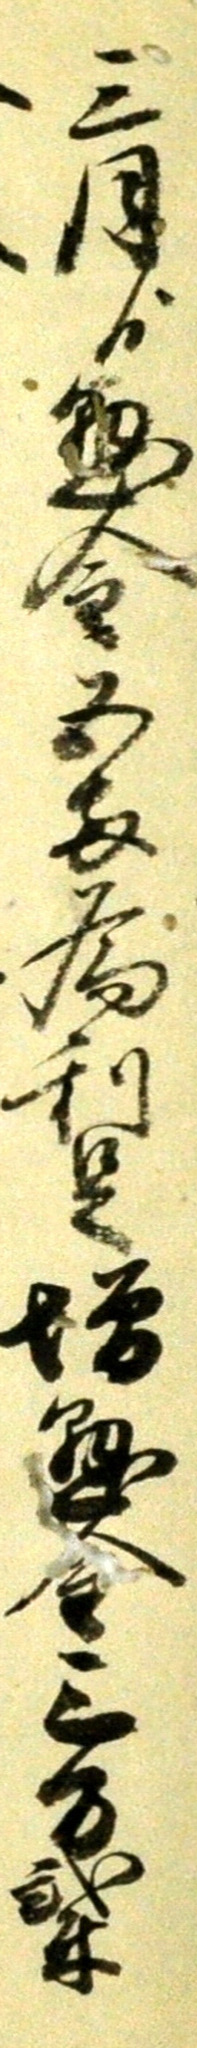三月ゟ懸金五両為利足増懸金三分弐朱
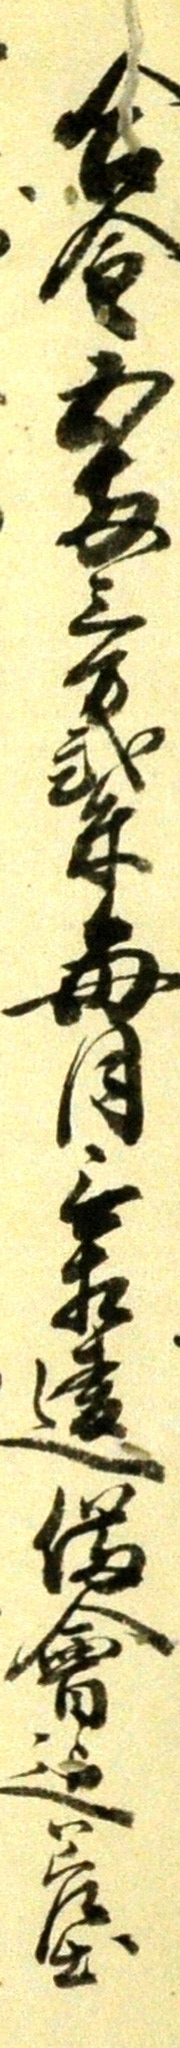合金五両三分弐朱毎月無相違備会迄差出
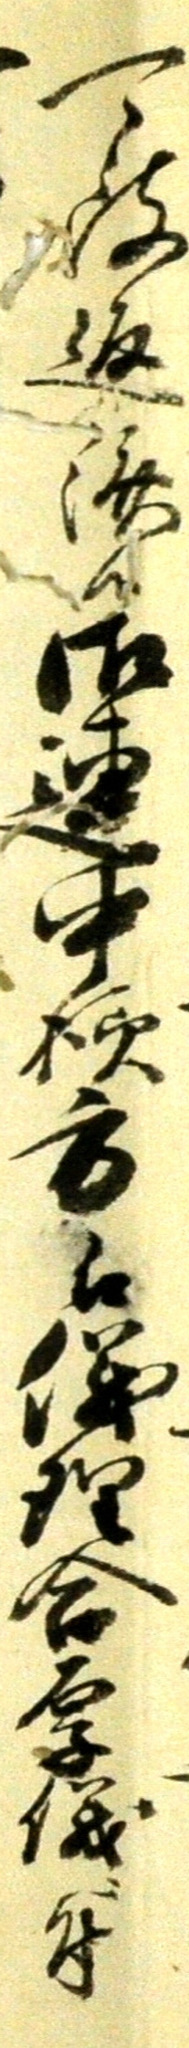可致返済候御連中様方江儀理合厚儀ニ付
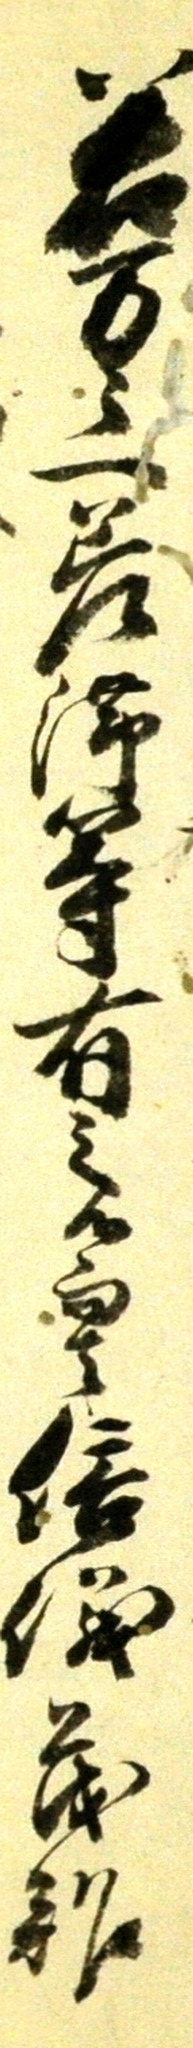若万々一差滞等有之候而者倍儀茂難
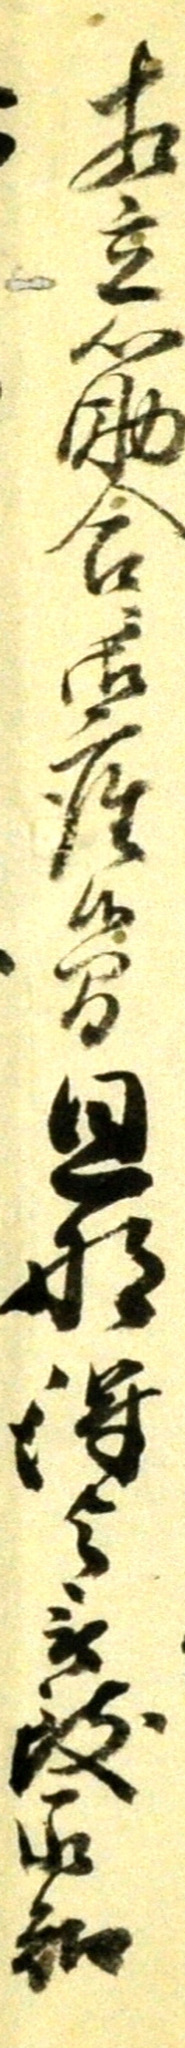相立筋合ニ御座候間旦那江与被致承知
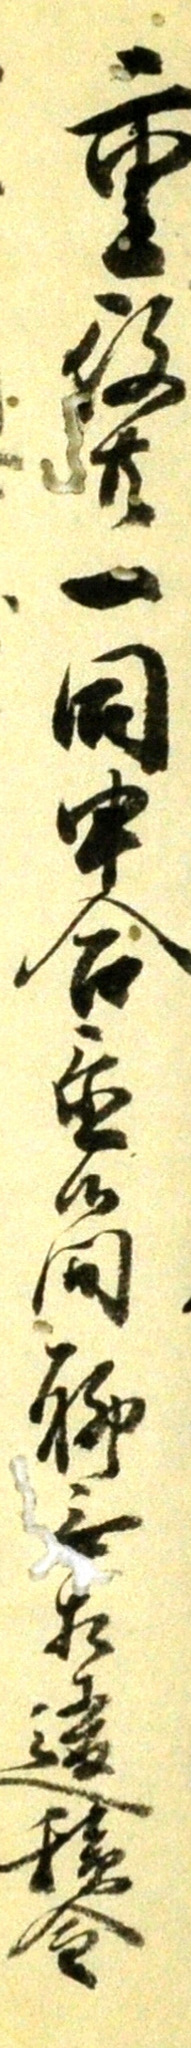重役共一同申合置候間聊無相違積金
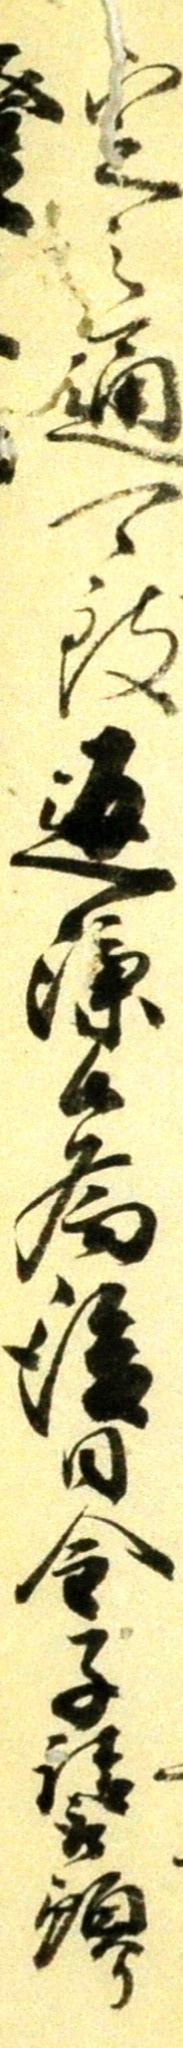定之通可致返済候為後日金子請取預り
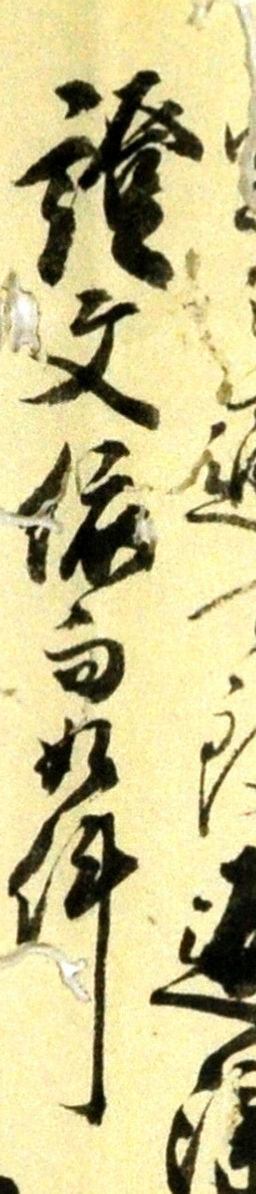証文仍而如件
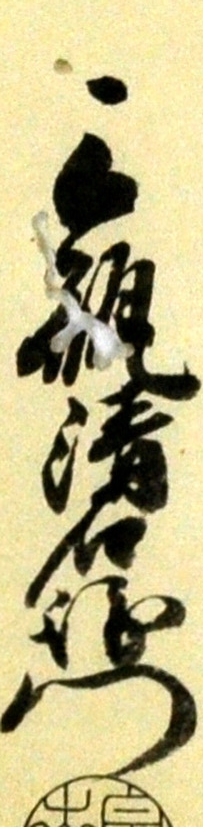三瓶清右衛門㊞
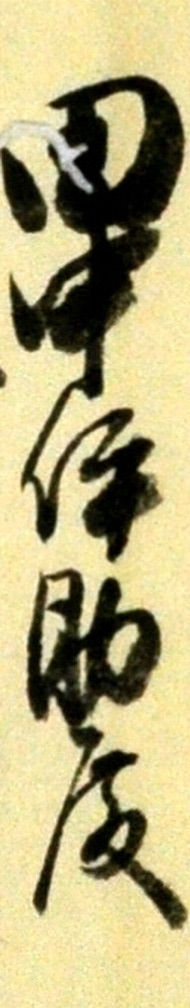田中伊助殿
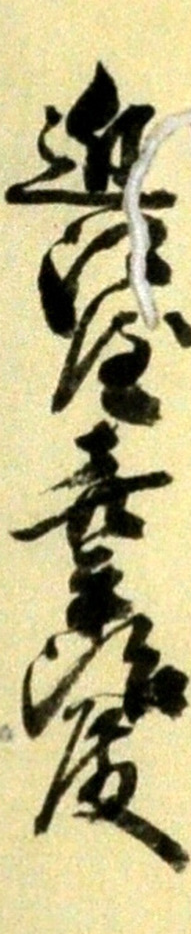近江屋喜平治殿
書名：預り申金子之事
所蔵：伊那市立高遠町図書館・合同会社AMANE
